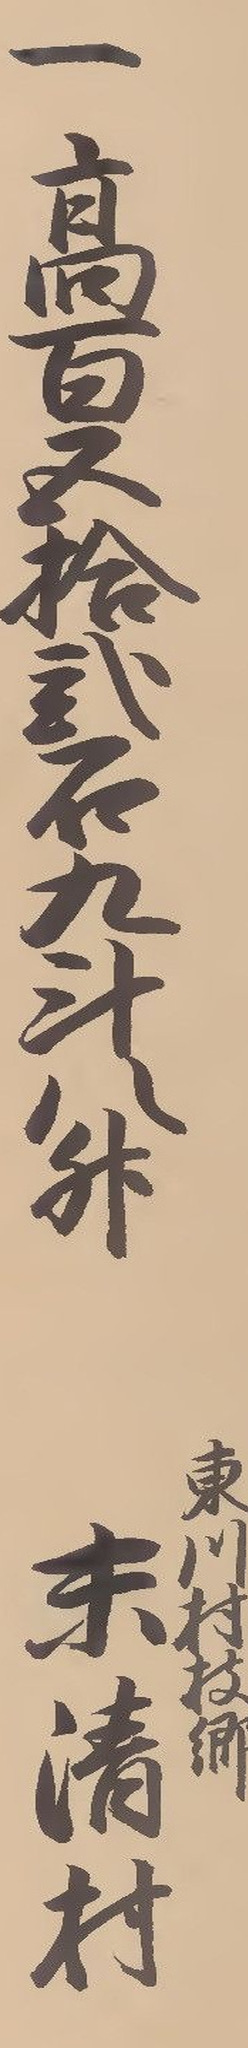一髙百五拾弐石九斗八升末清村
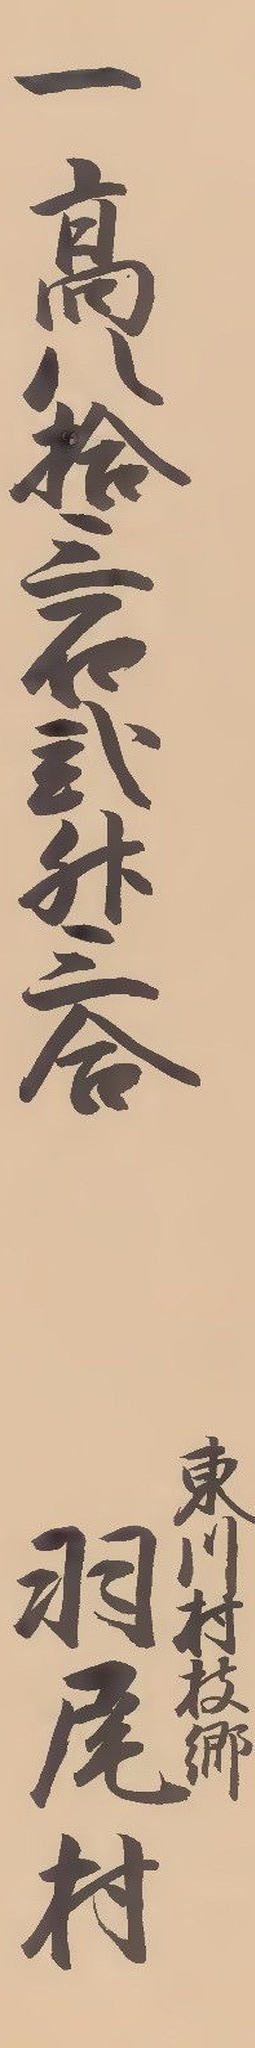一髙八拾三石弐升三合羽尾村

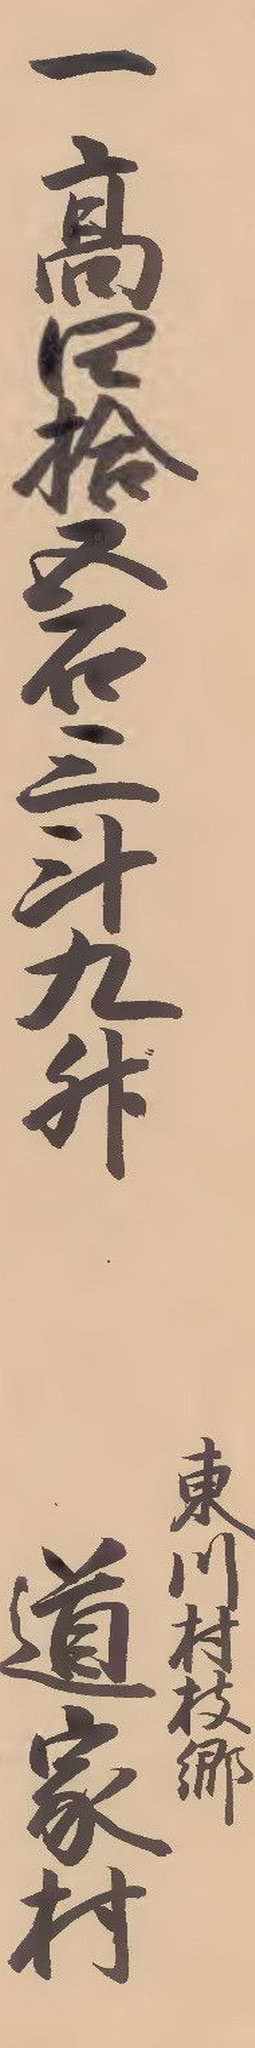一髙四拾五石三斗九升道家村
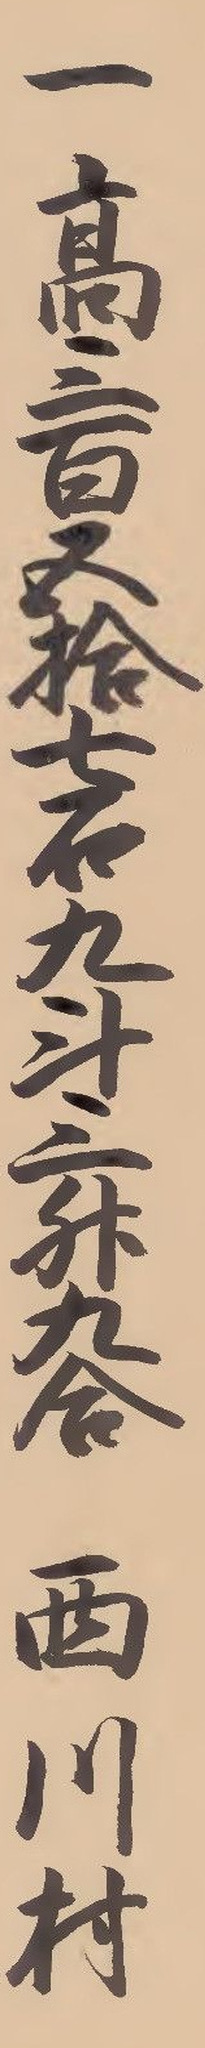一髙三百五拾七石九斗三升九合西川村
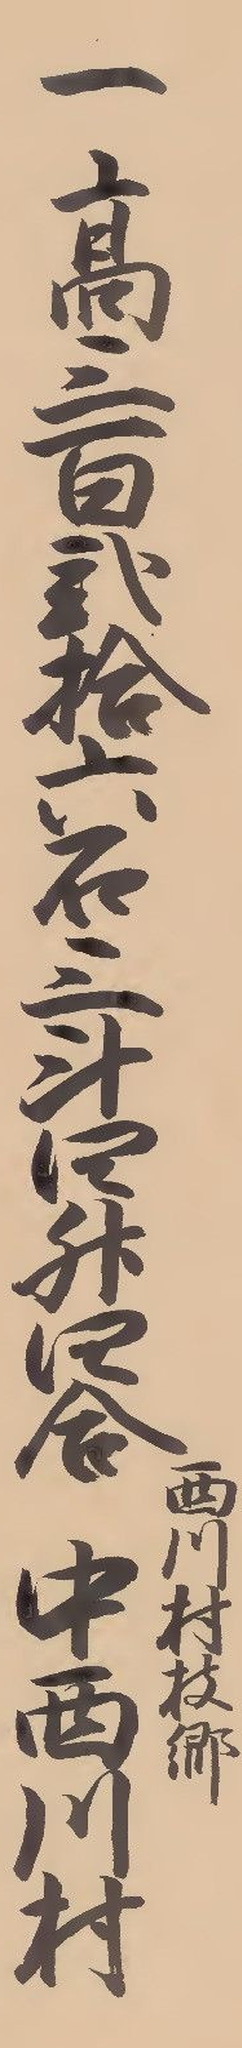一髙三百弐拾六石三斗四升四合中西川村
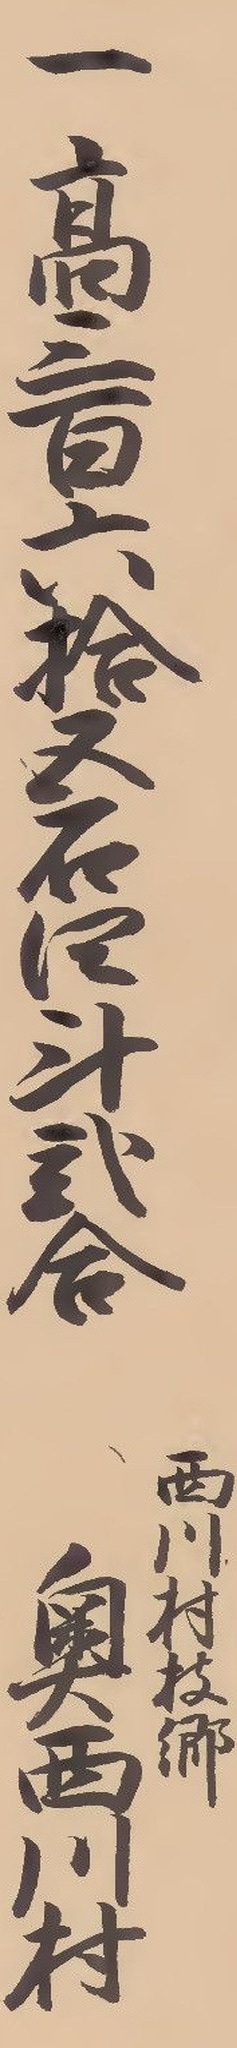一髙三百六拾五石四斗弐合奥西川村
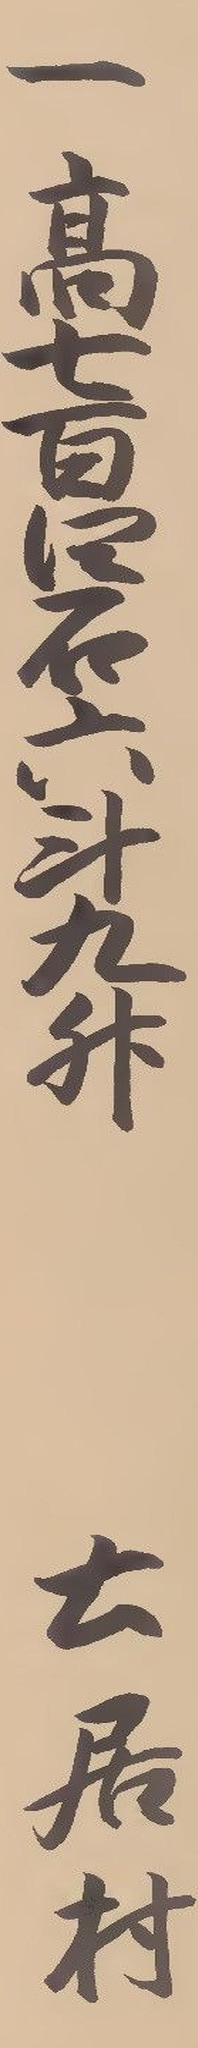一髙七百四石六斗九升土居村
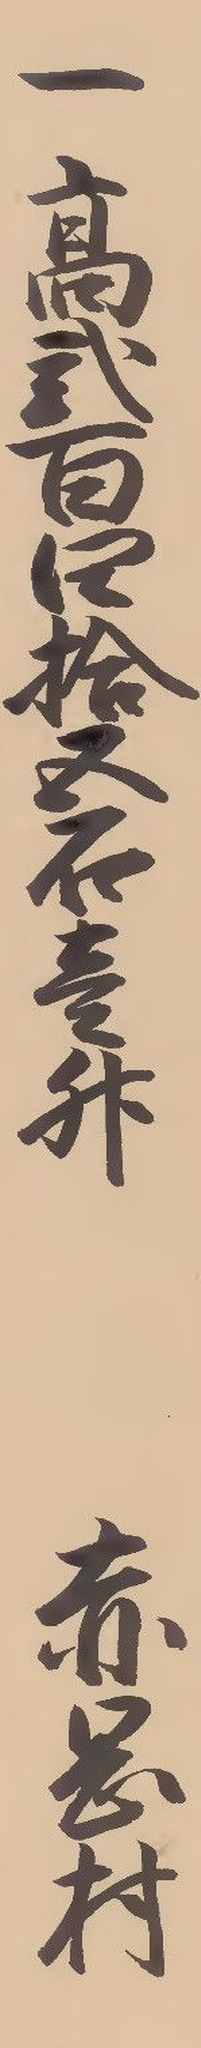一髙弐百四拾五石壱升赤岡村
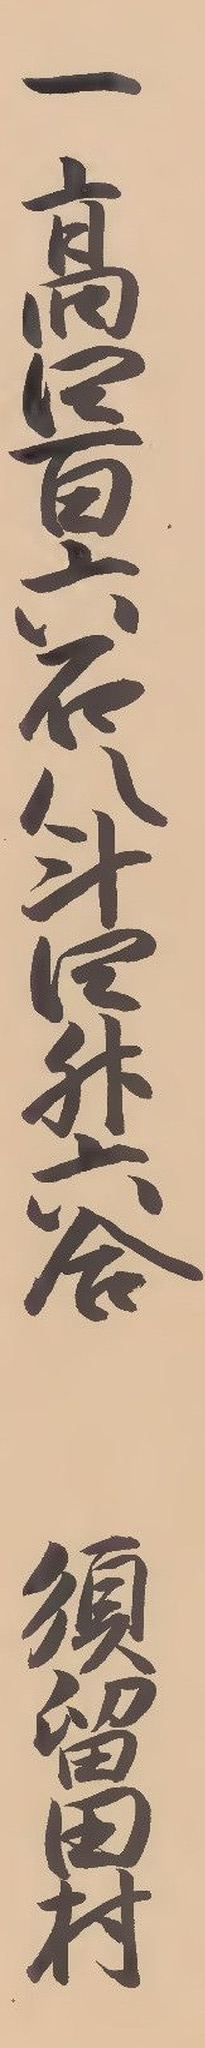一髙四百六石八斗四升六合須留田村
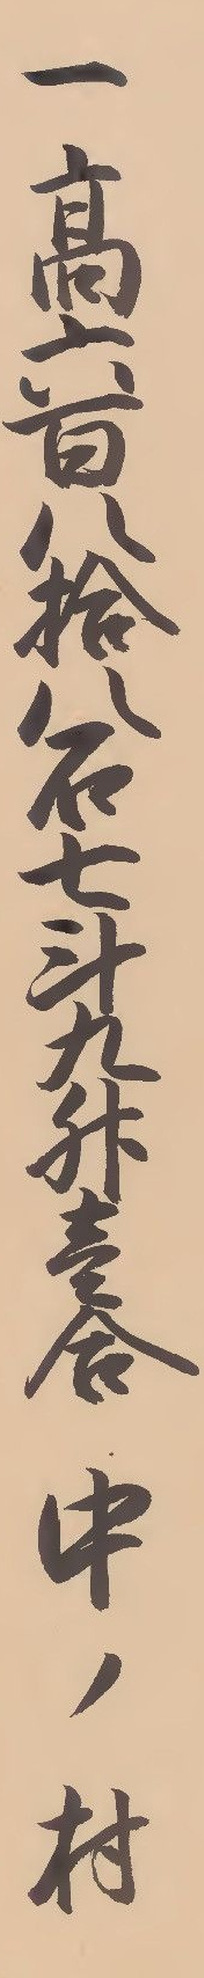一髙六百八拾八石七斗九升壱合中ノ村

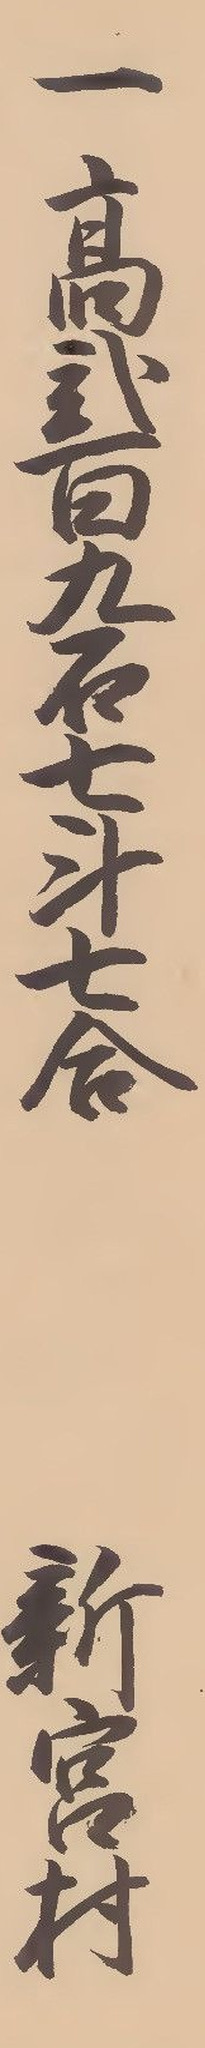一髙弐百九石七斗七合新宮村
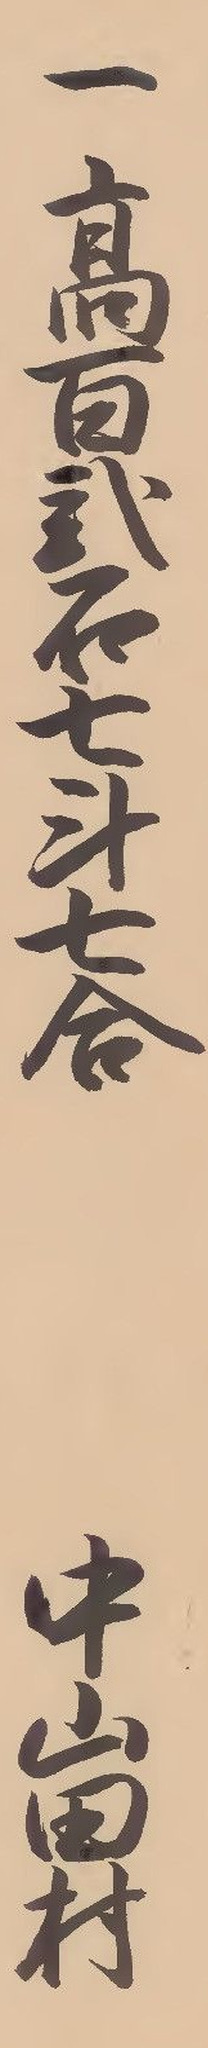一髙百弐石七斗七合中山田村
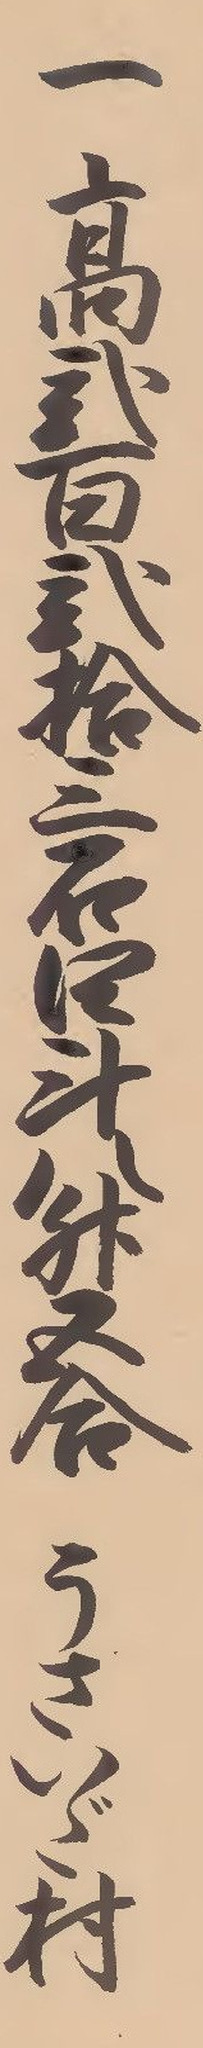一髙弐百弐拾三石四斗八升五合うさいだ村
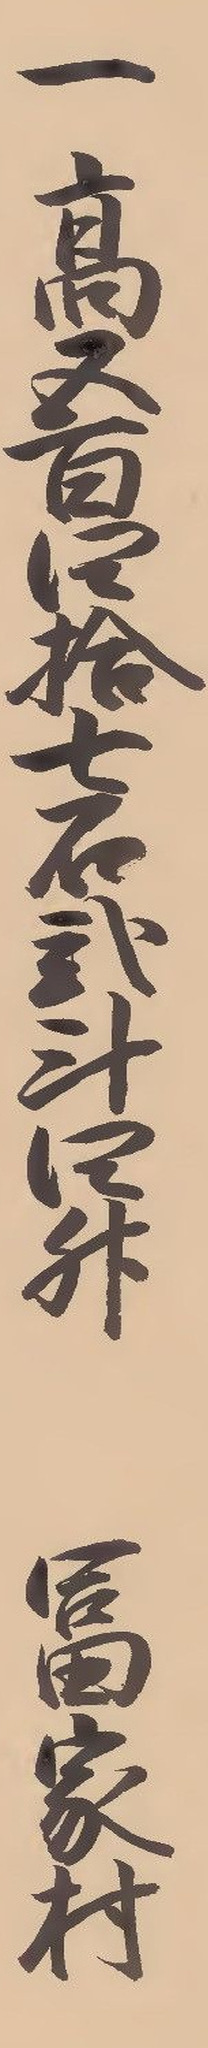一髙五百四拾七石弐斗四升冨家村
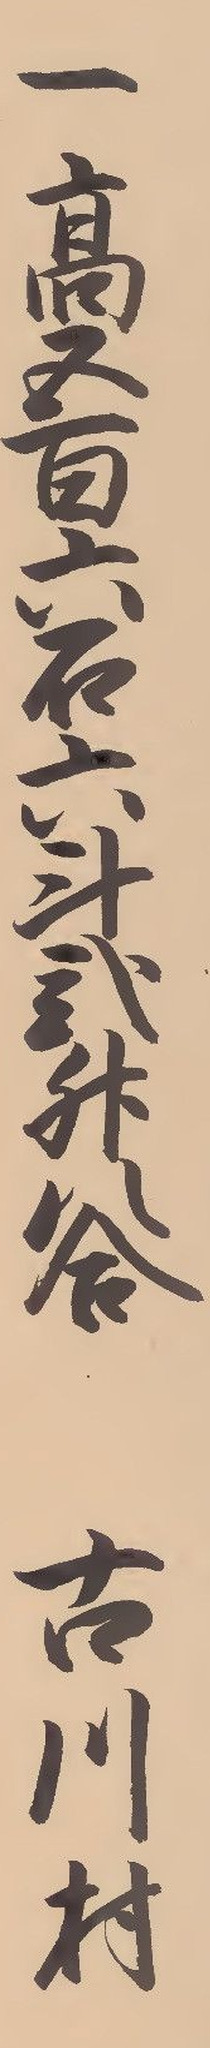一髙五百六石六斗弐升八合古川村
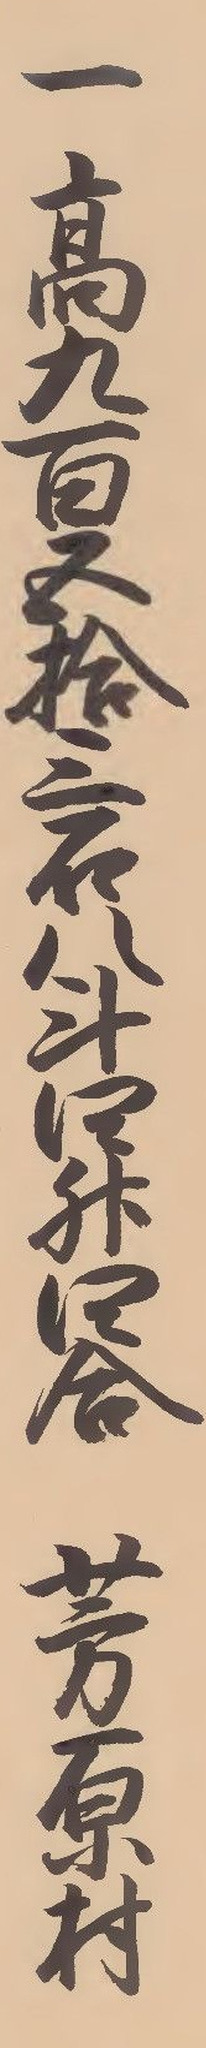一髙九百五拾三石八斗四升四合芳原村
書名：土佐国郷帳
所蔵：国立公文書館 National Archives of Japan
